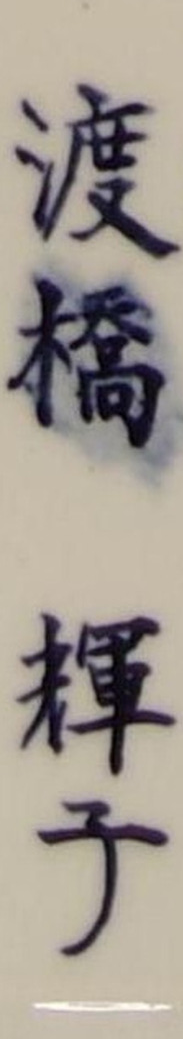渡橋輝子
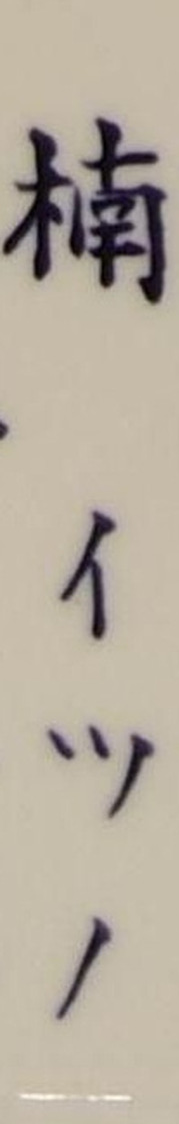楠イツノ
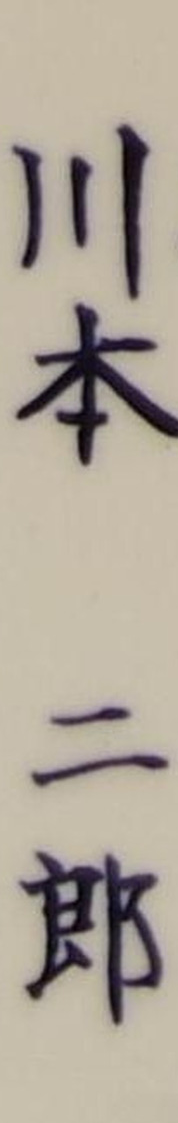川本二郎
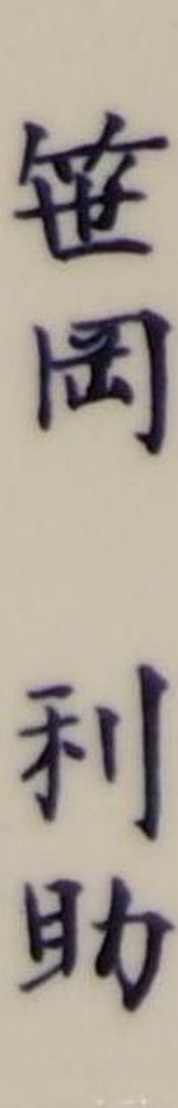笹岡利助
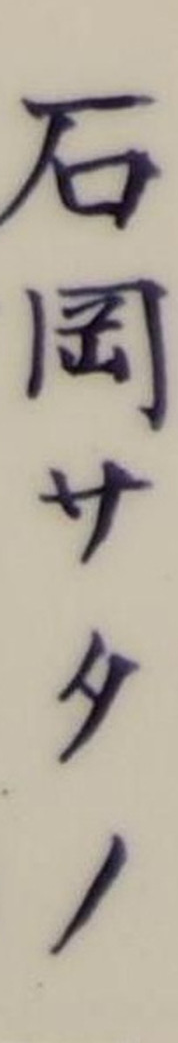石岡サタノ
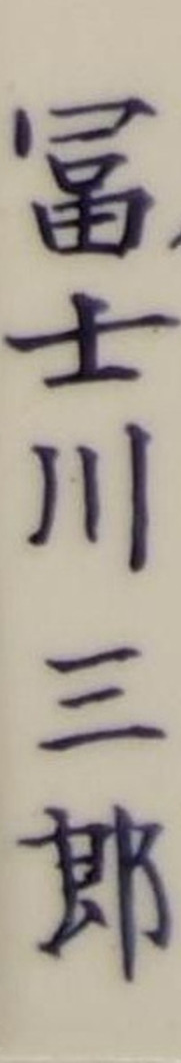冨士川三郎

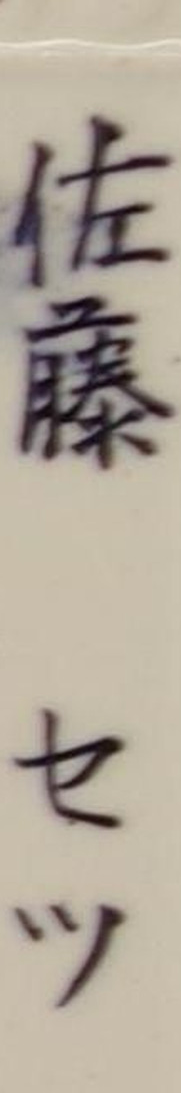佐藤セツ
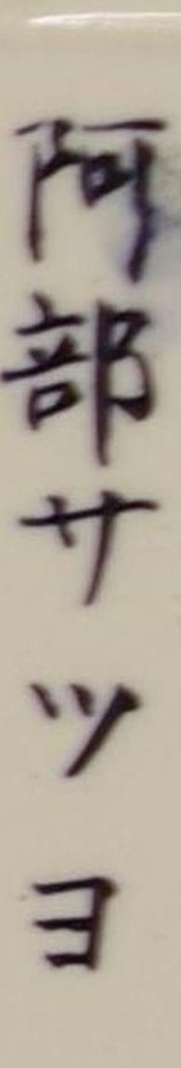阿部サツヨ
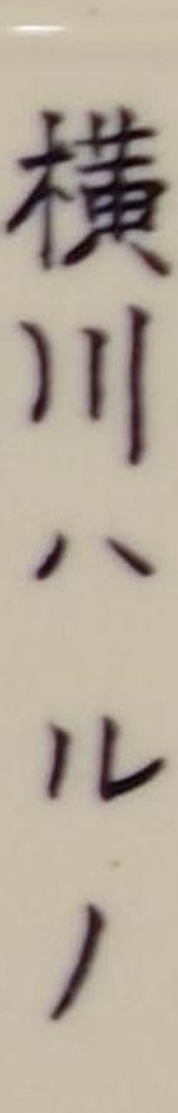横川ハルノ
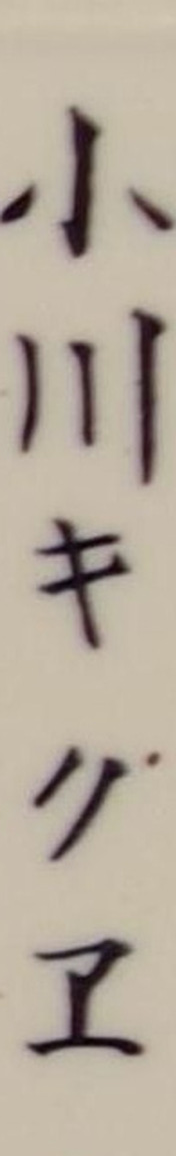小川キクヱ
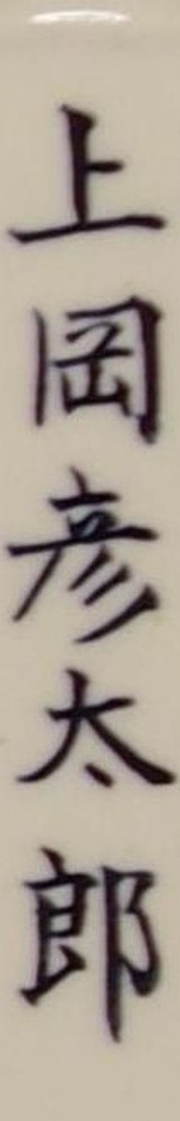上岡彦太郎
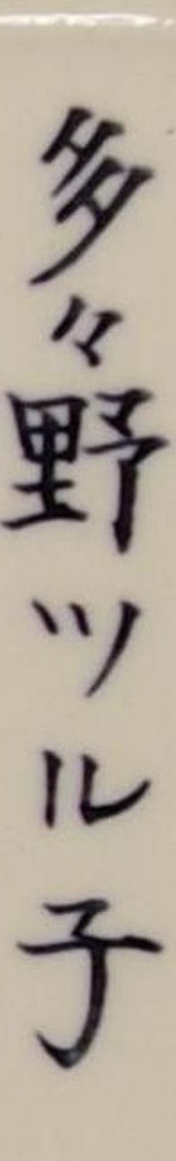多々野ツル子
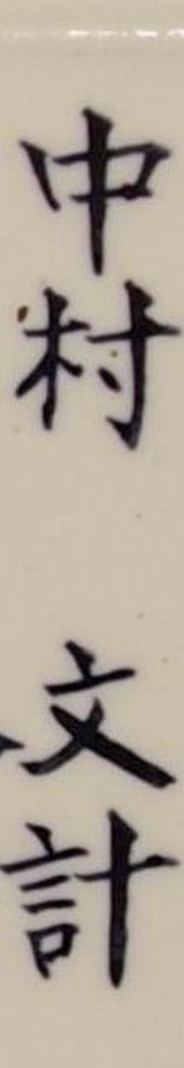中村文計
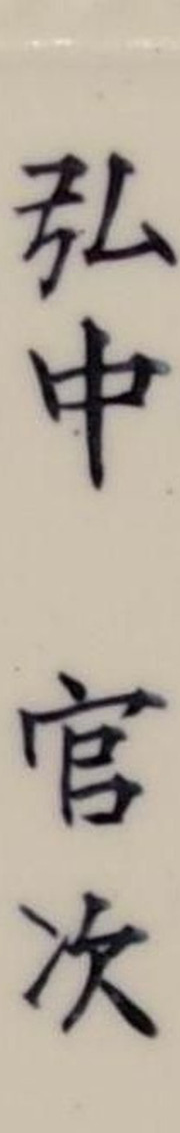弘中官次
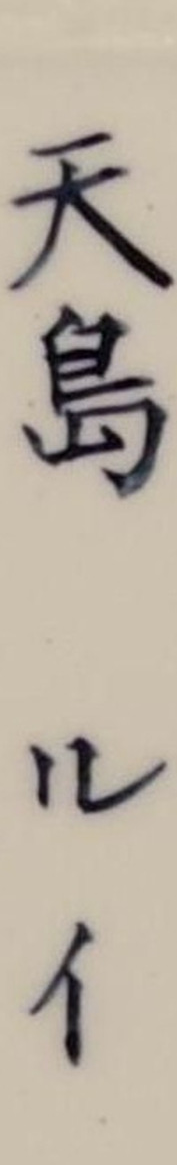天島ルイ
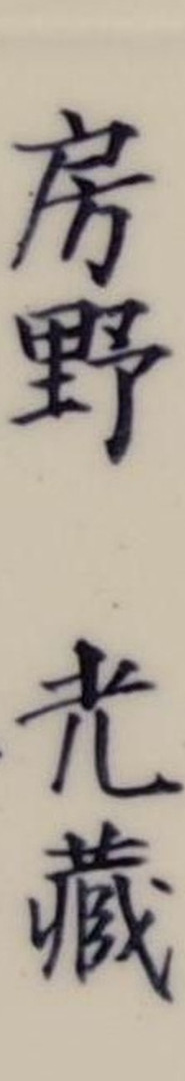房野光蔵
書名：E~L
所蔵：高野山金剛峯寺
